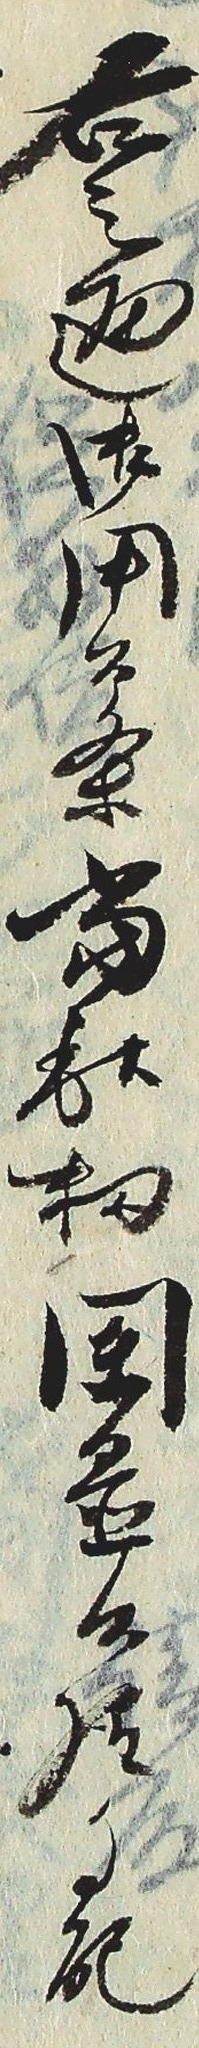右の通御用候条当秋囷置候様手配
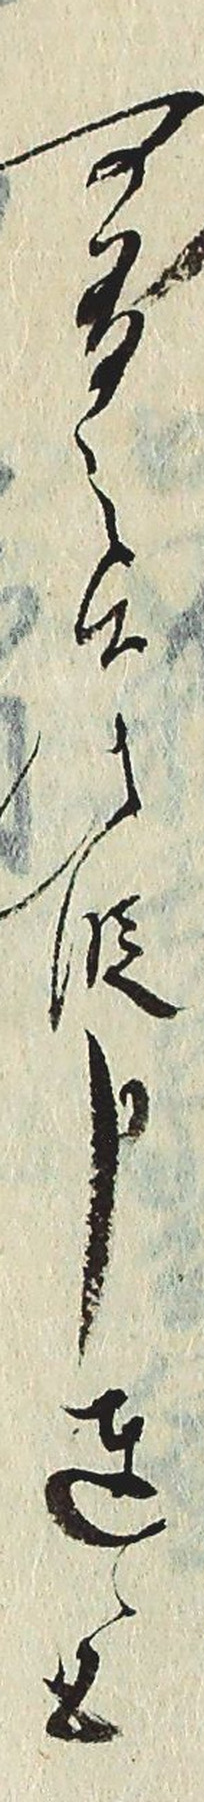可有之候此段申達候以上
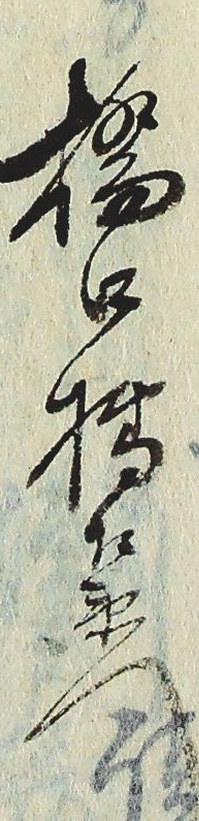橋口橘左衛門
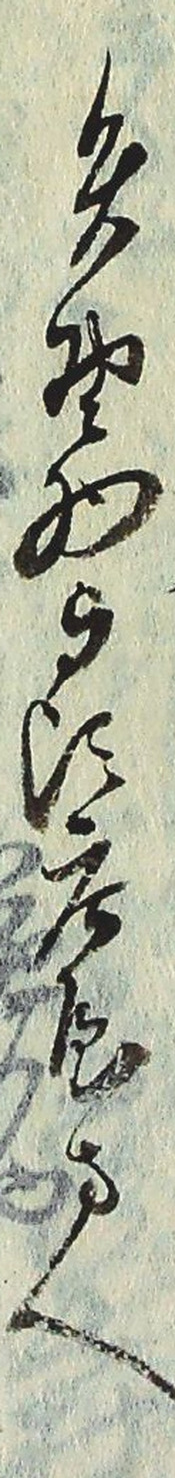矢野村与頭庄屋方へ
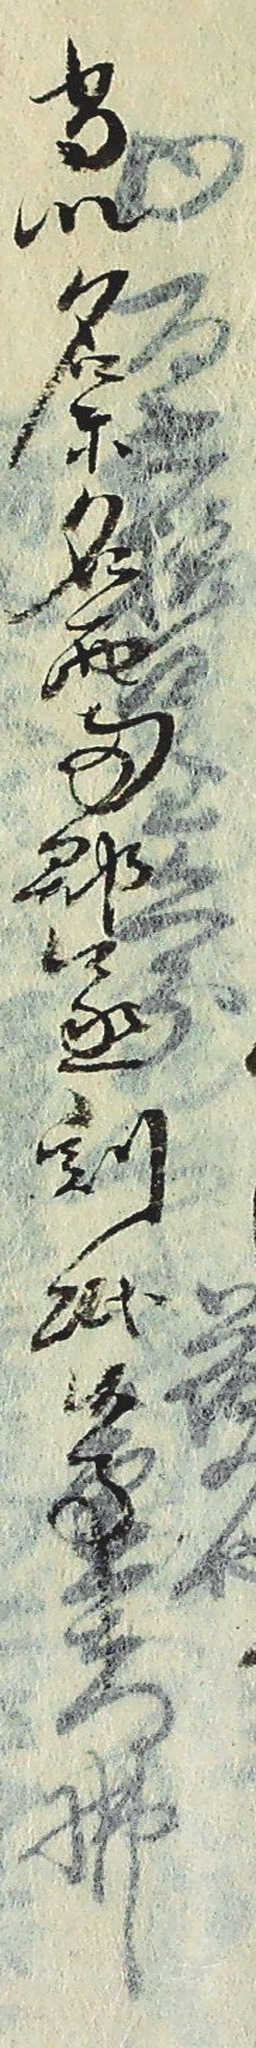尚以名東名西両郡遂割賦候事
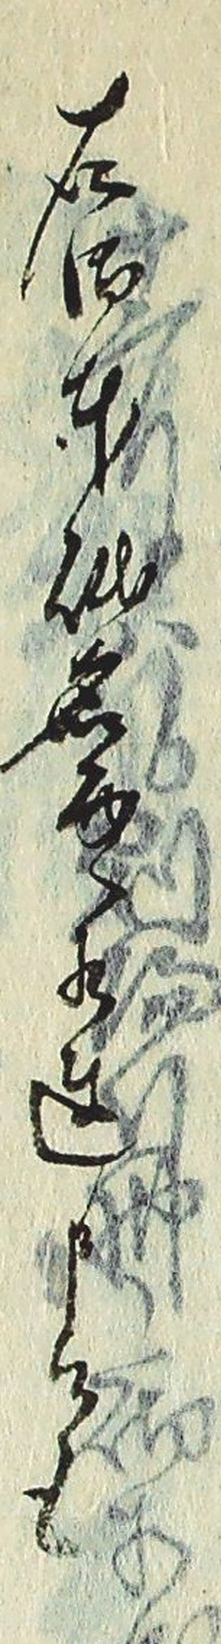右御本紙名西へ相達申候以上
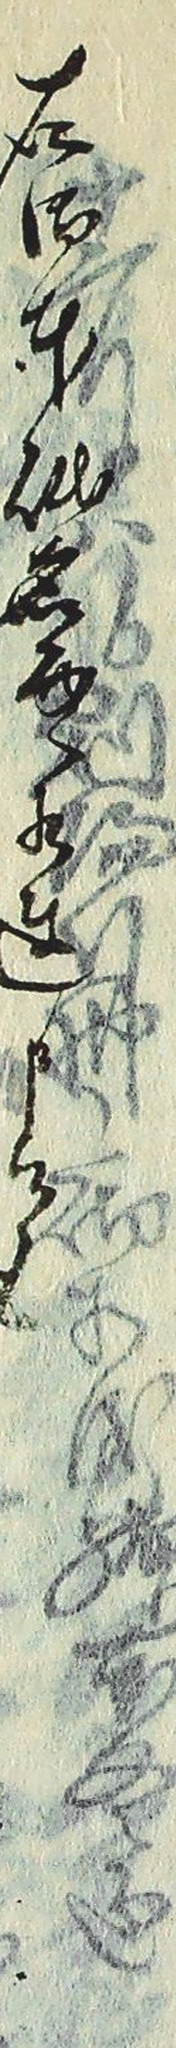右御本紙名西へ相達申候以上

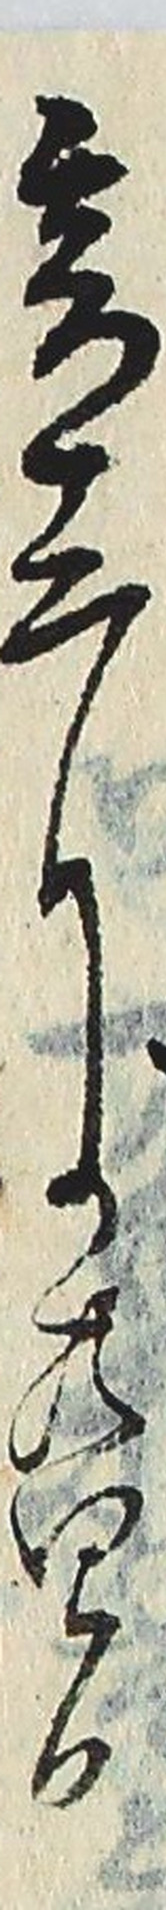亥十二月廿四日
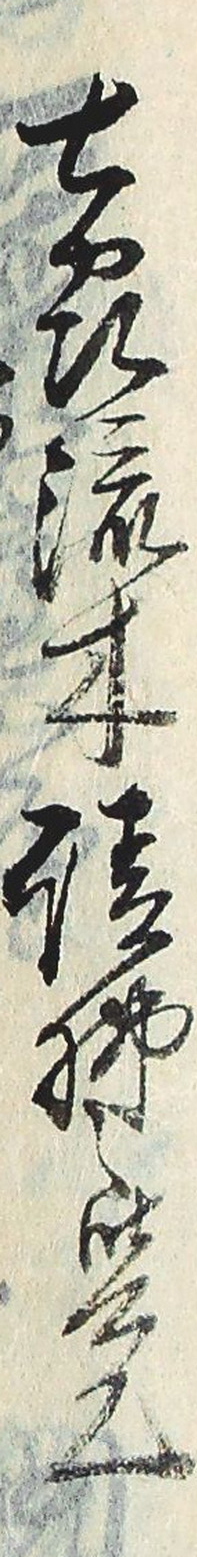土州流木請払之覚
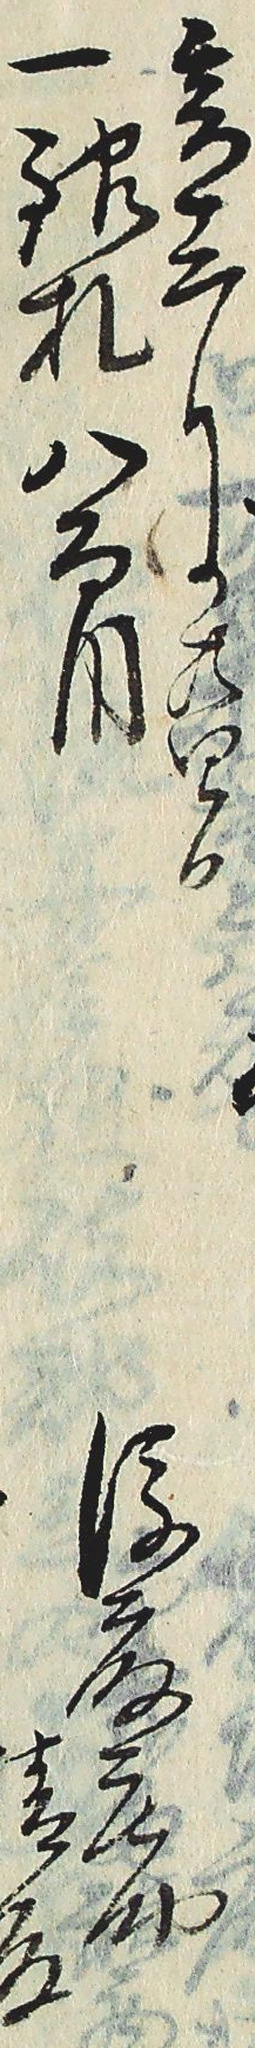一銀札八百目後藤庄助
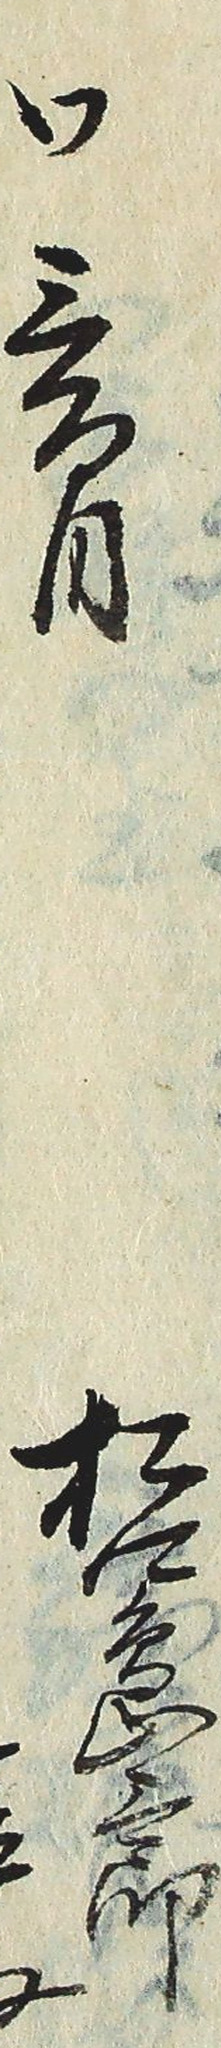一同三百目松江島三郎
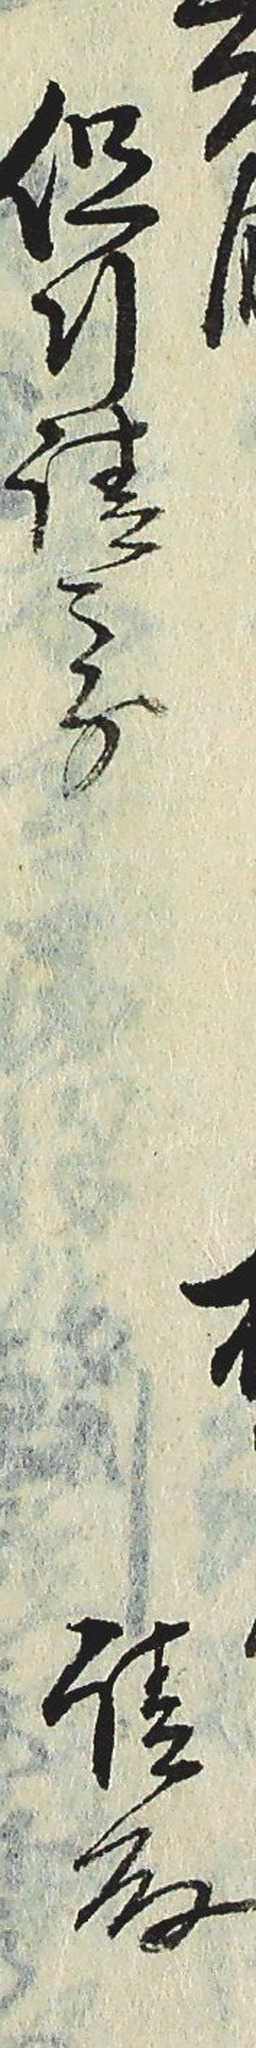但引請之分請取
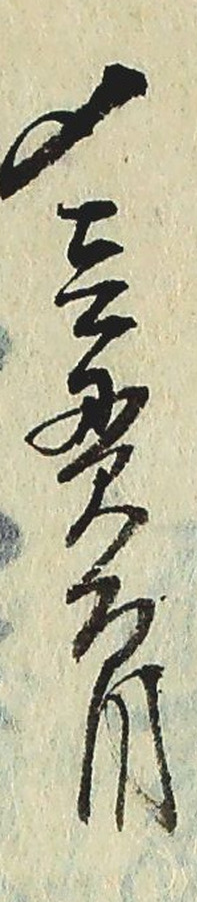〆壱貫百目
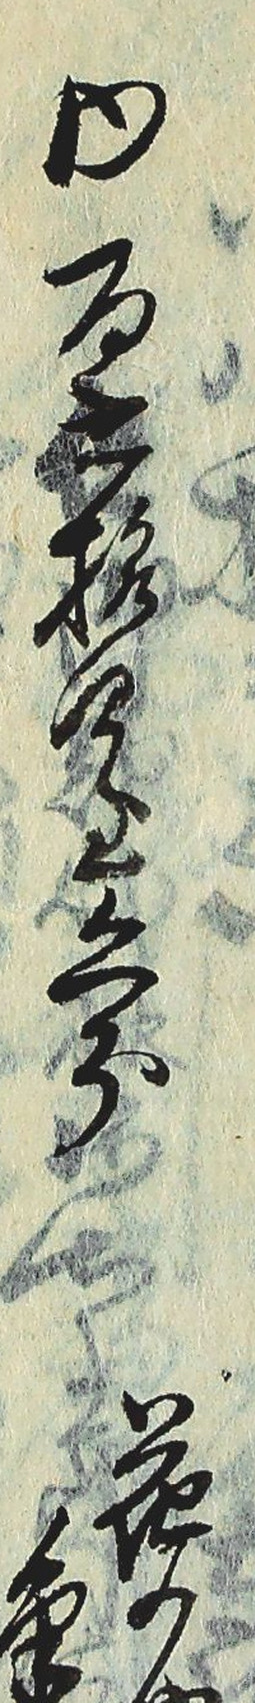内百六拾四匁六分花のや
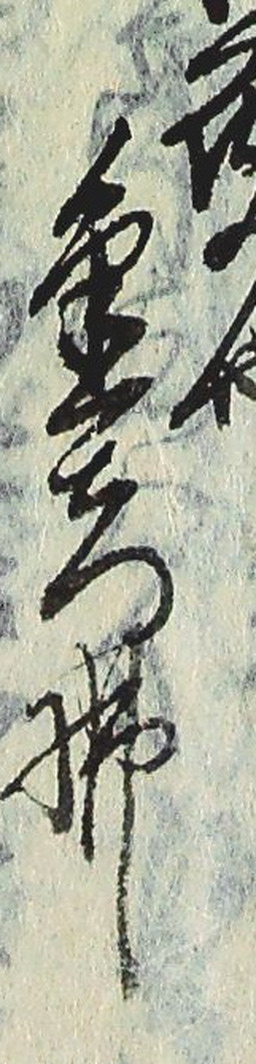重右衛門払
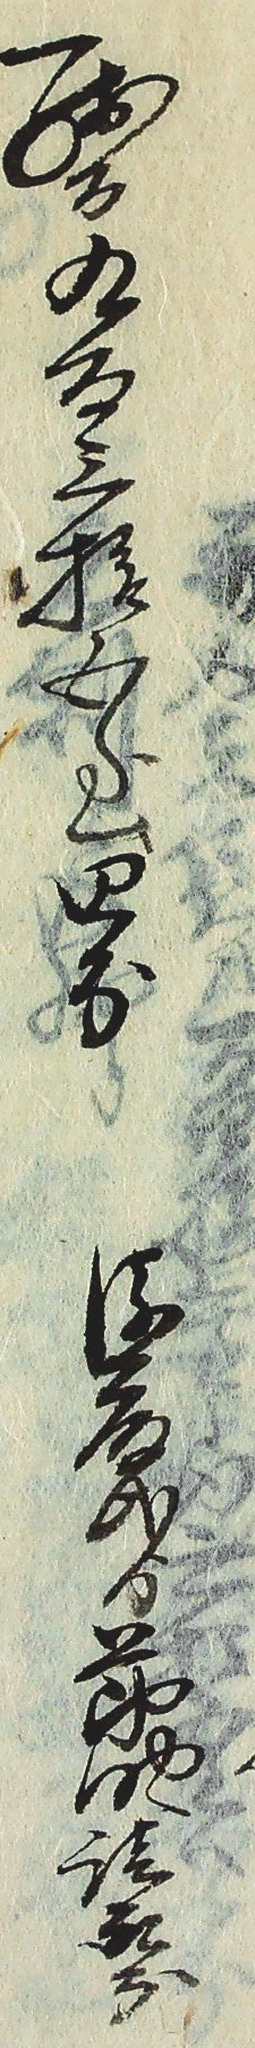残て九百三拾五匁四分後藤氏ゟ節助へ請取分
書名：名東郡中諸割賦元帳
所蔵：鳴門教育大学 Naruto University of Education
